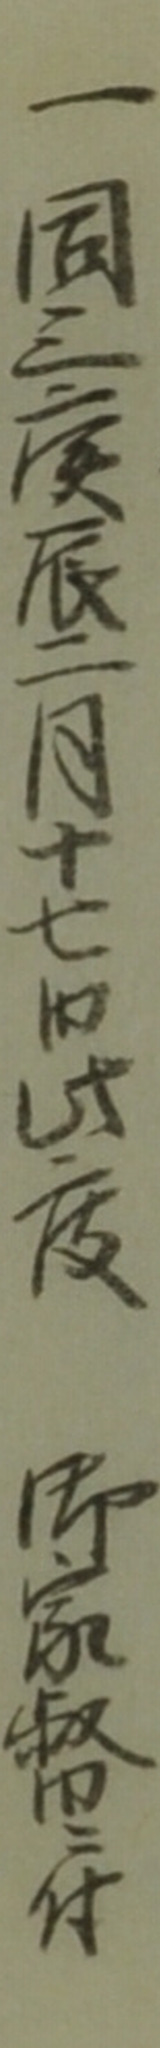一同三庚辰二月十七日此度御家督ニ付
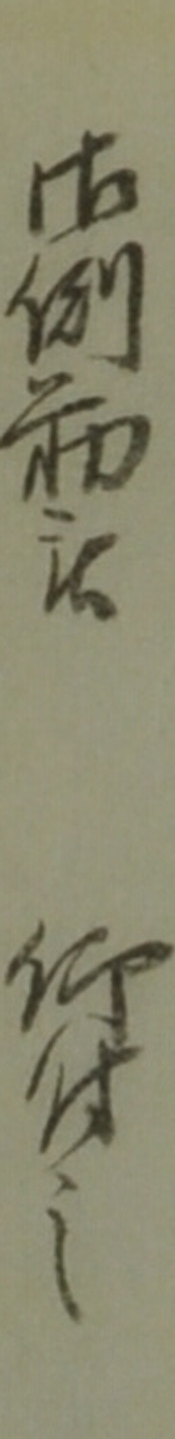御側勤被仰付之
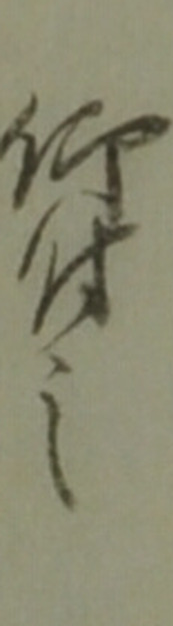仰付之
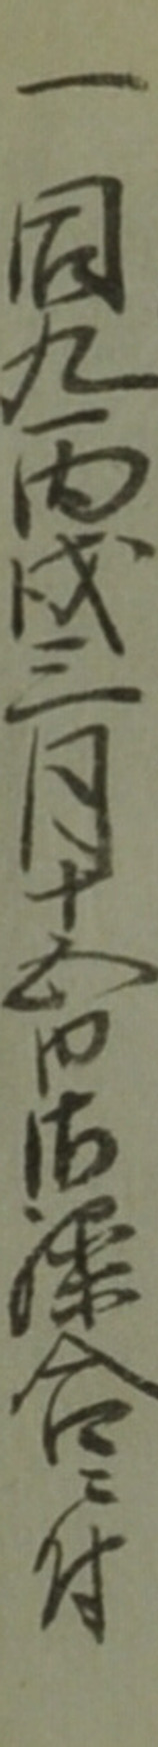一同九丙戌三月十五日御繰合ニ付
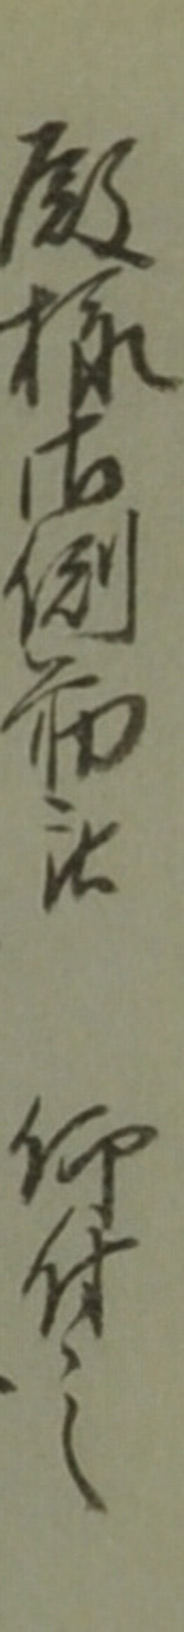殿様御側勤被仰付之
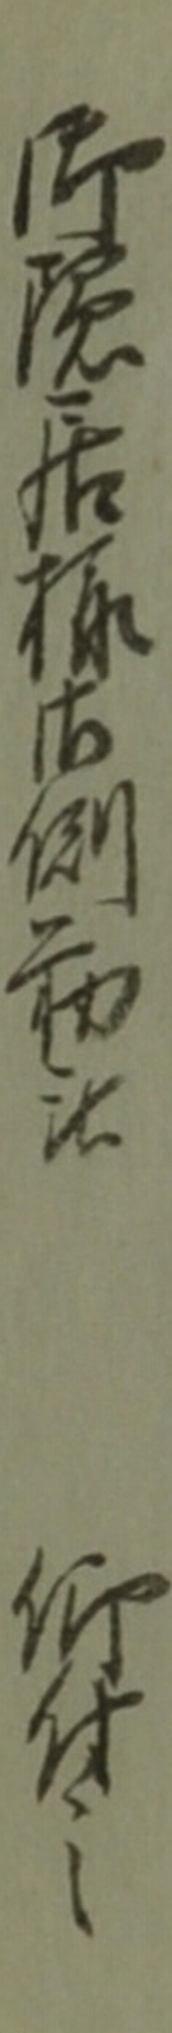御隠居様御側勤被仰付之
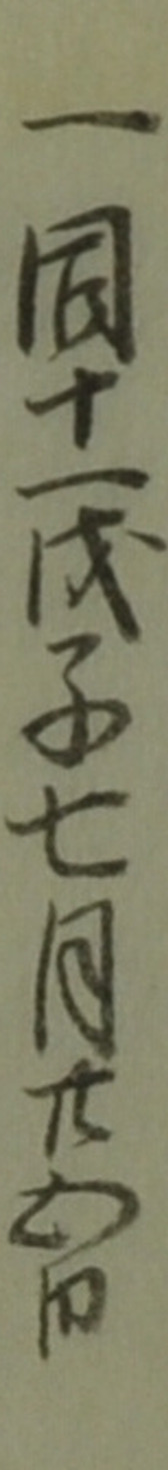一同十一戊子七月廿五日
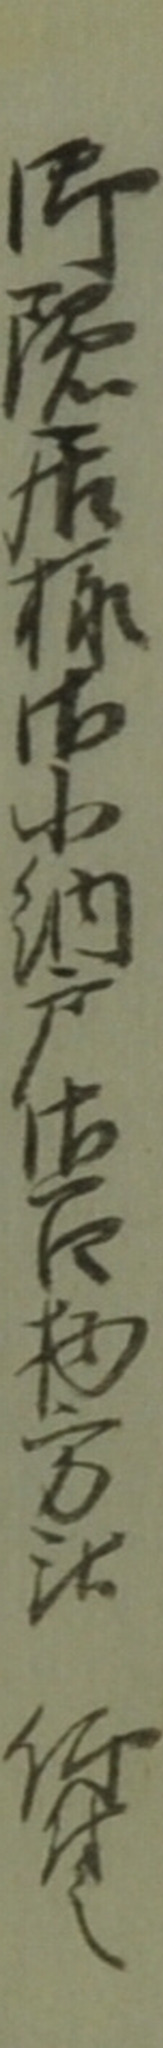御隠居様御小納戸御召物方被仰付之
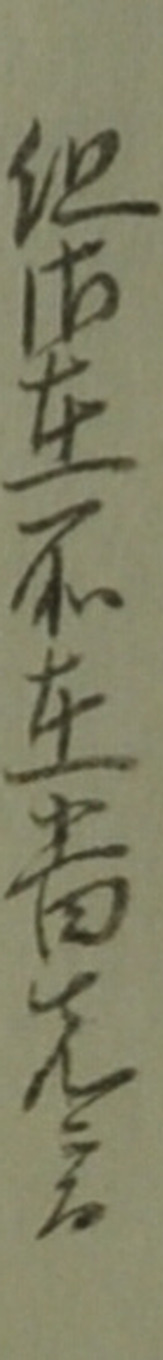但御在所在番先ニ而
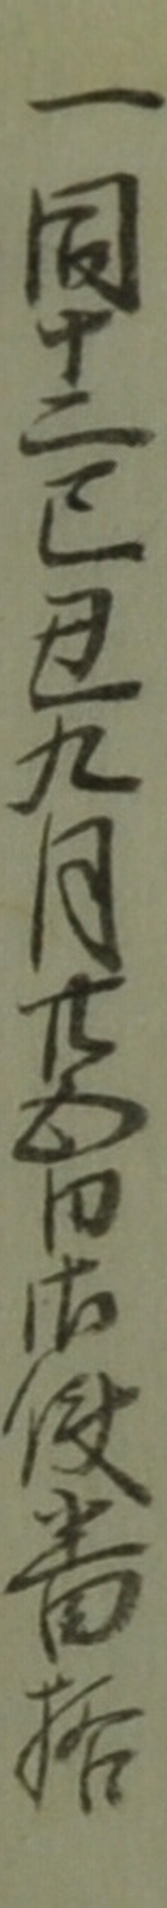一同十二己丑九月廿五日御使番格
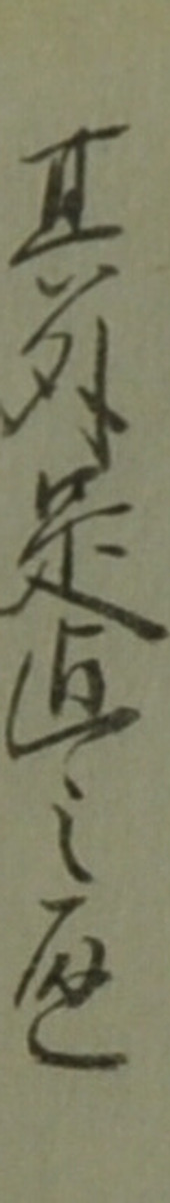其外是迄之通
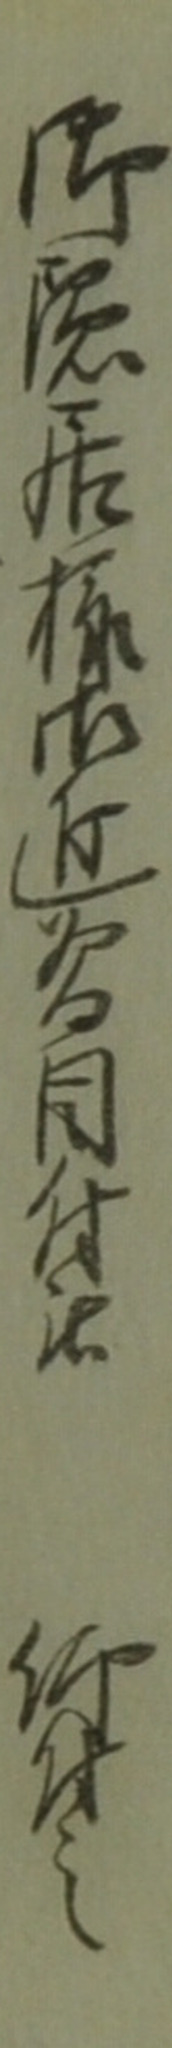御隠居様御近習目付被仰付之
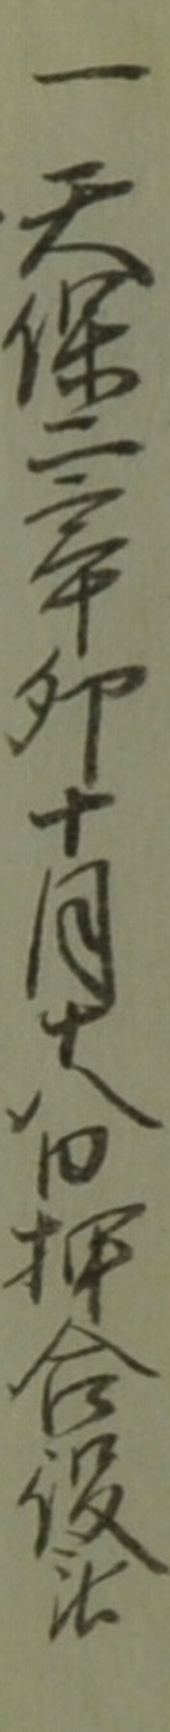一天保二辛卯十月十八日押合役被
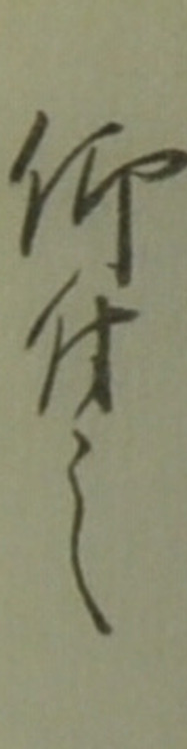仰付之

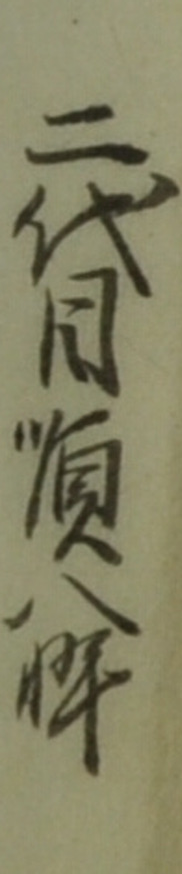二代目順八忰
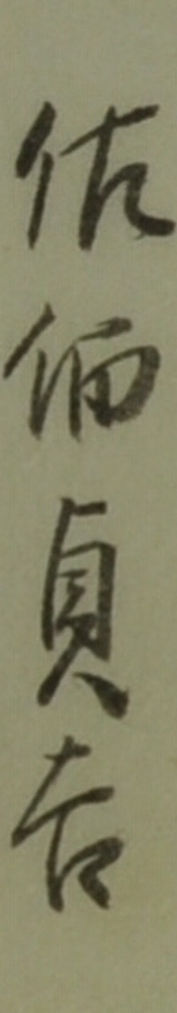佐伯貞吉
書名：諸御役代々録（五）
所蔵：伊那市立高遠町図書館・合同会社AMANE
